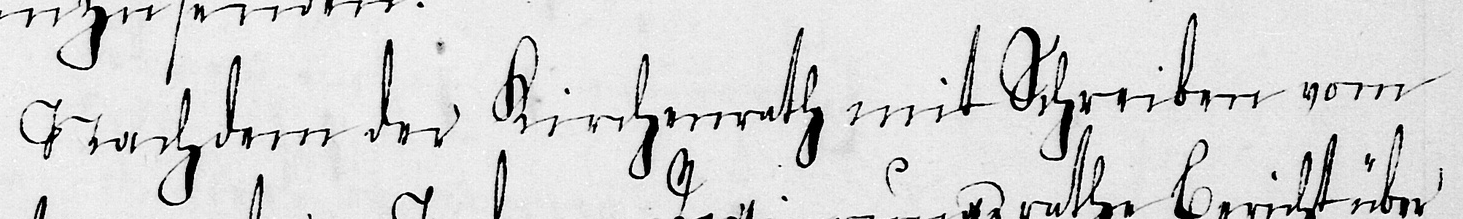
Nachdem der Kirchenrath mit Schreiben vom
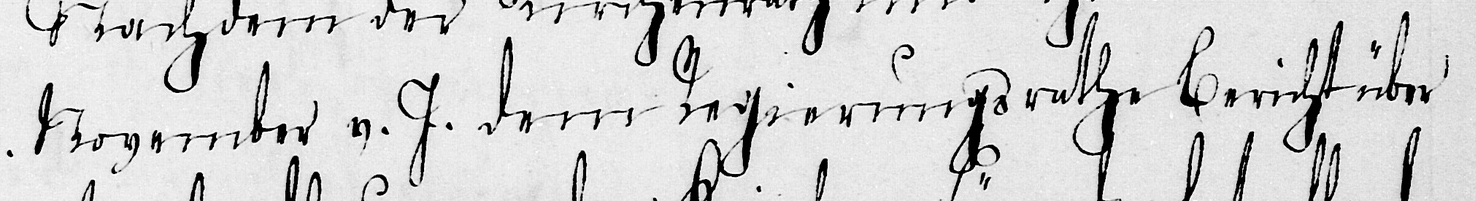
November v. J. dem Regierungsrathe Bericht über
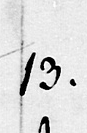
13.
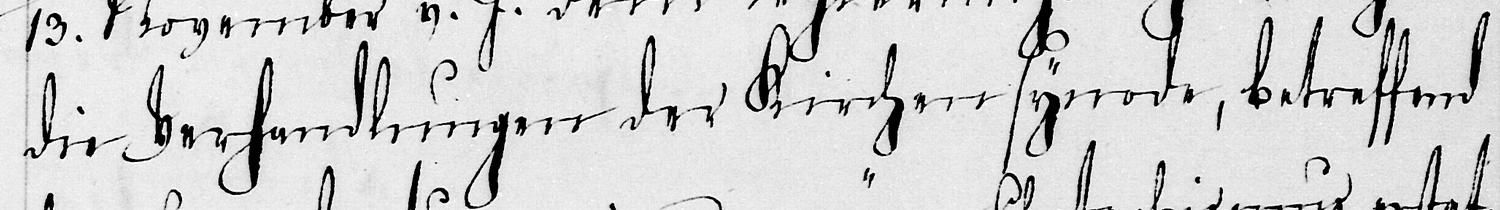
die Verhandlungen der Kirchensynode, betreffend
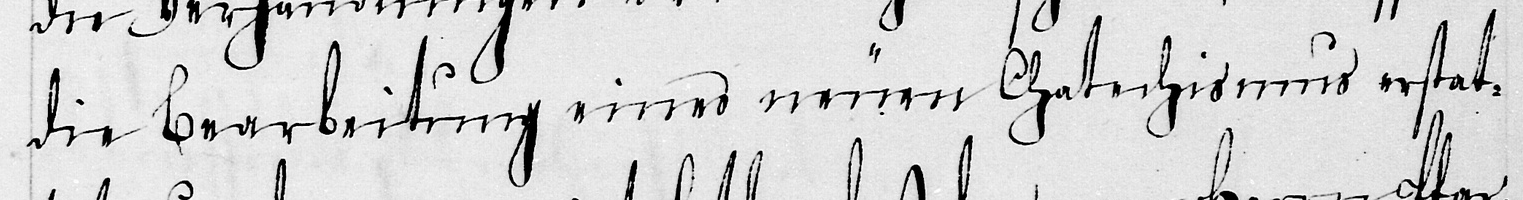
die Bearbeitung eines neuen Chatechismus erstat¬
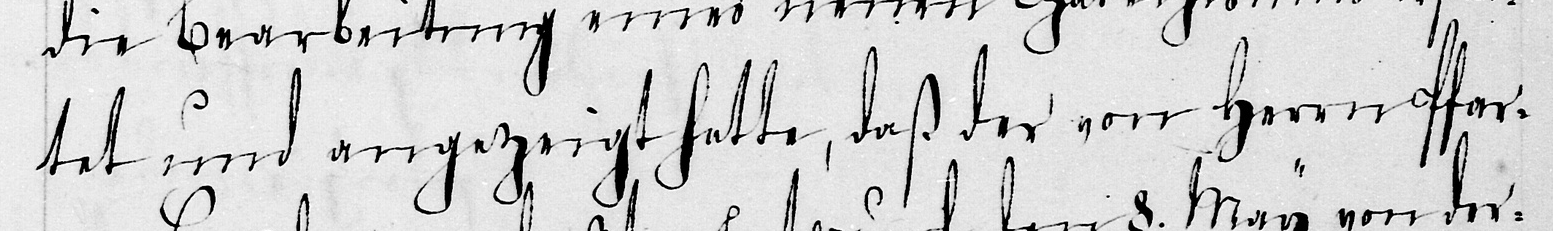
tet und angezeigt hatte, daß der von Herrn Pfar¬
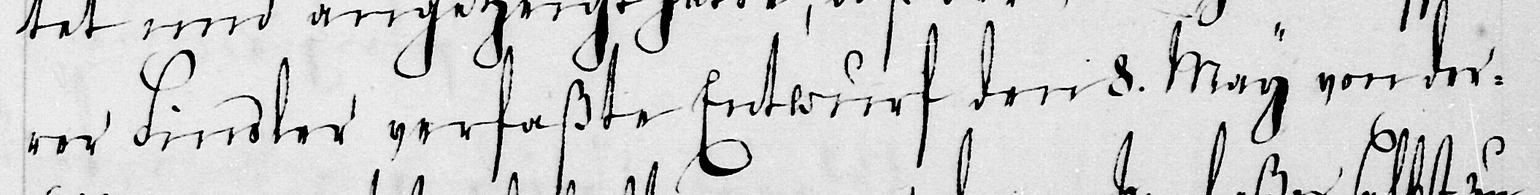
rer Finsler verfaßte Entwurf den 8. May von der¬
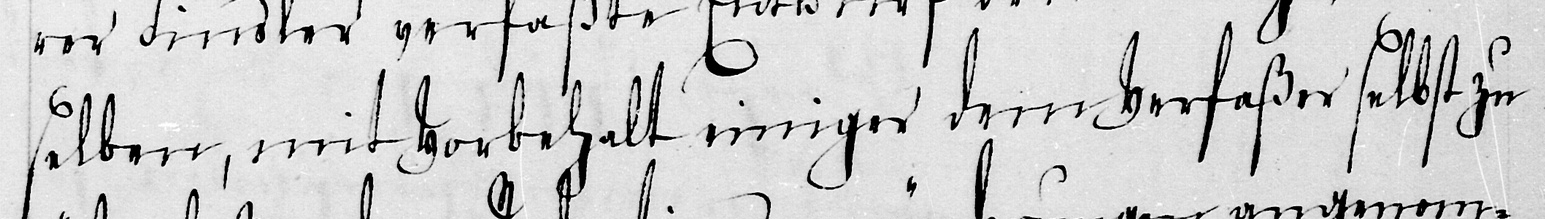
selben, mit Vorbehalt einiger dem Verfaßer selbst zu
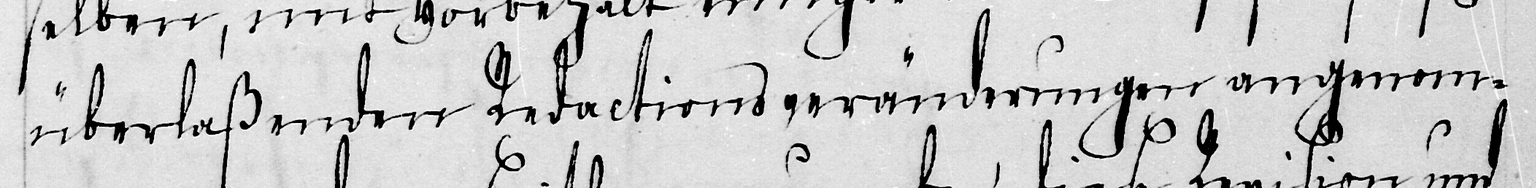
überlaßenden Redactionsveränderungen angenom¬
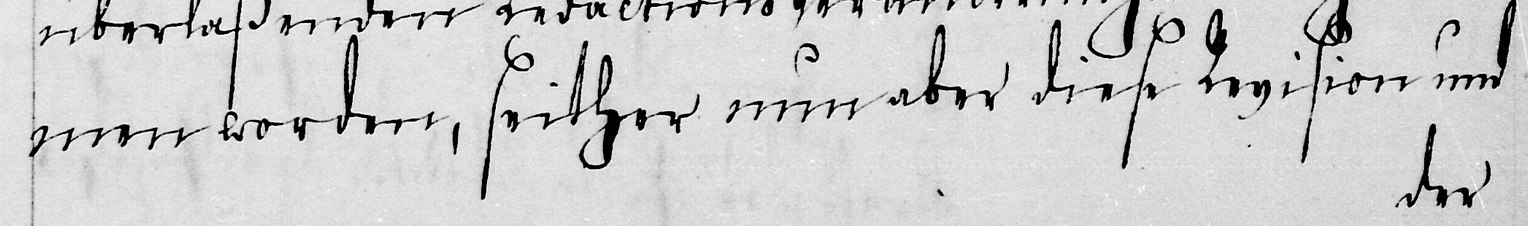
men worden, seither nun aber diese Revision und
